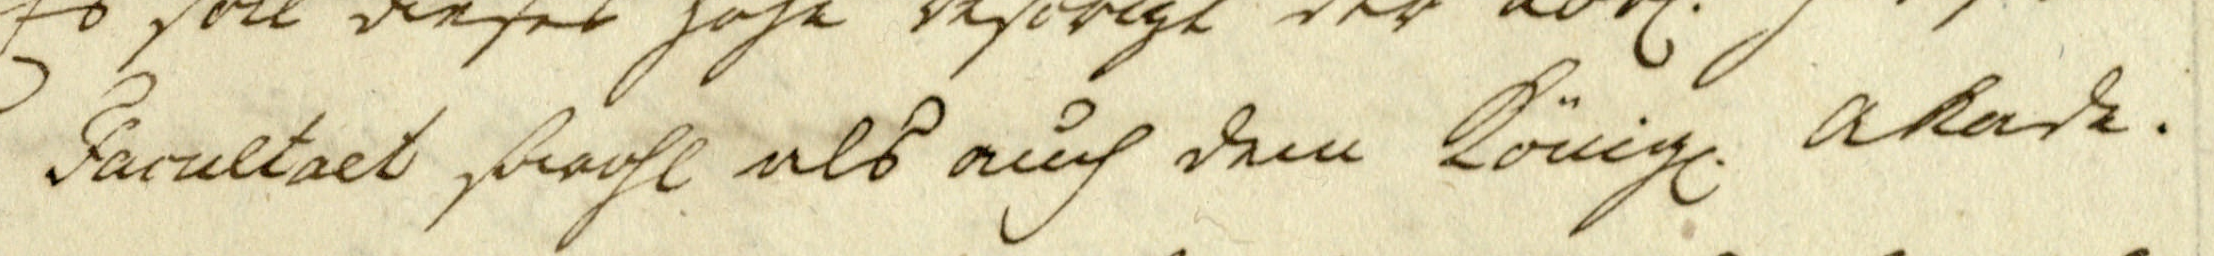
Facultaet sowohl als auch dem Königl. Akade¬
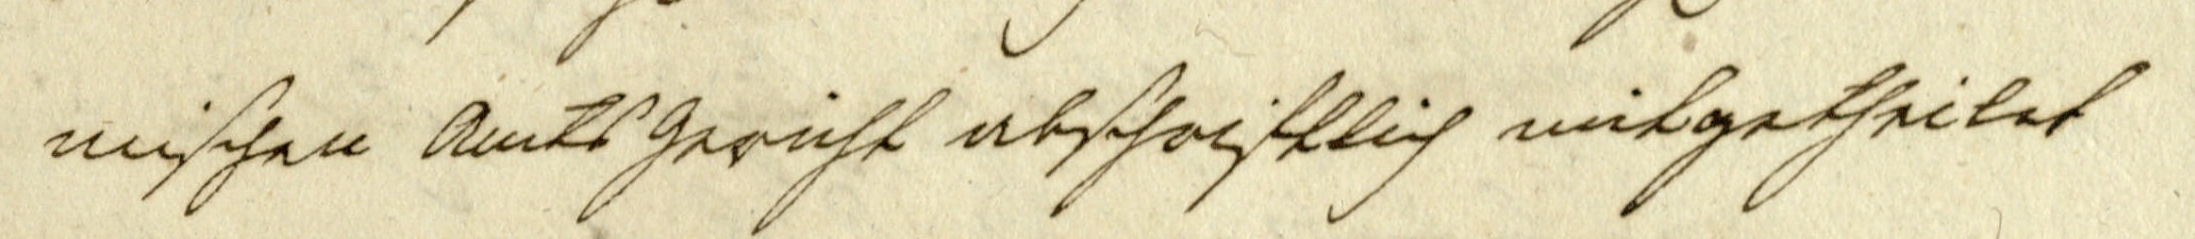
mischen Amtsgericht abschriftlich mitgetheilet
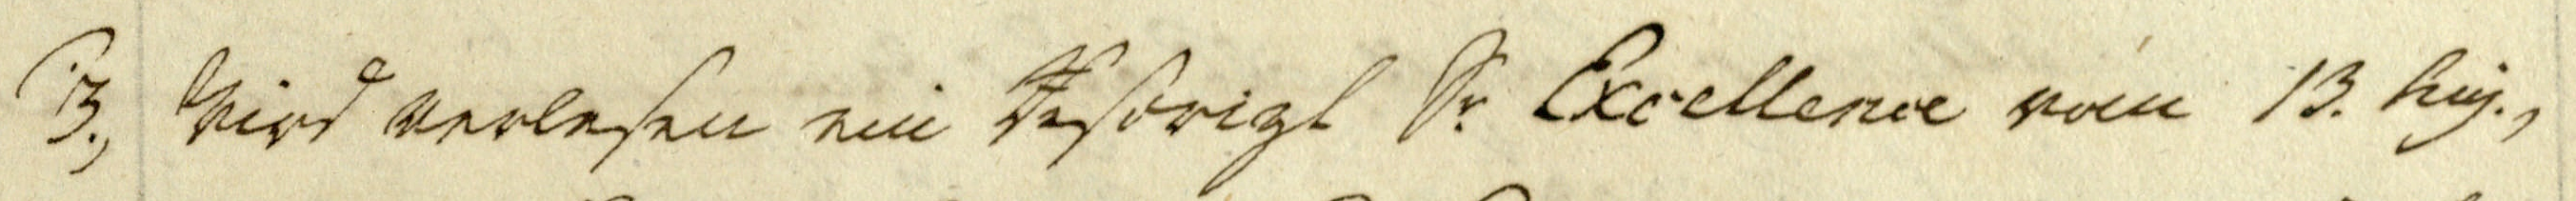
3., Wird verlesen ein Rescript Sr. Excellence vom 13. huj.,
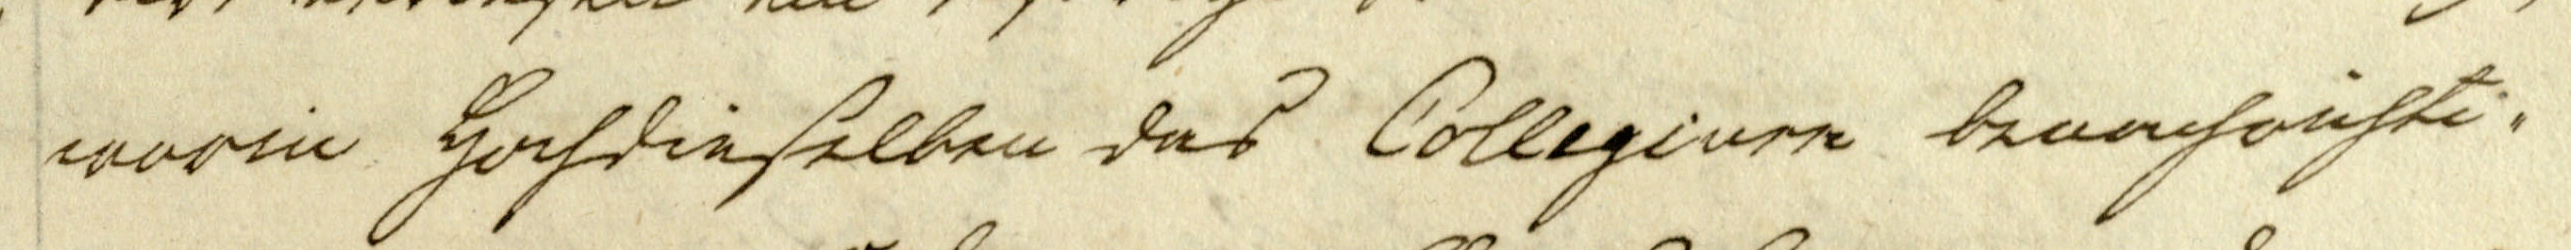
worin Hochdieselben das Collegium benachrichti¬
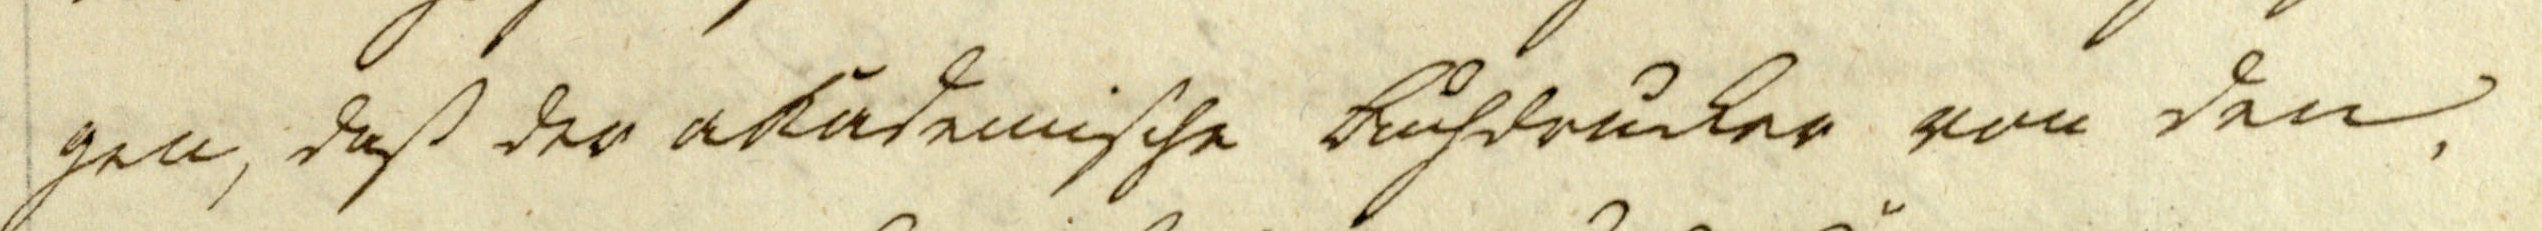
gen, daß der akademische Buchdrucker von den
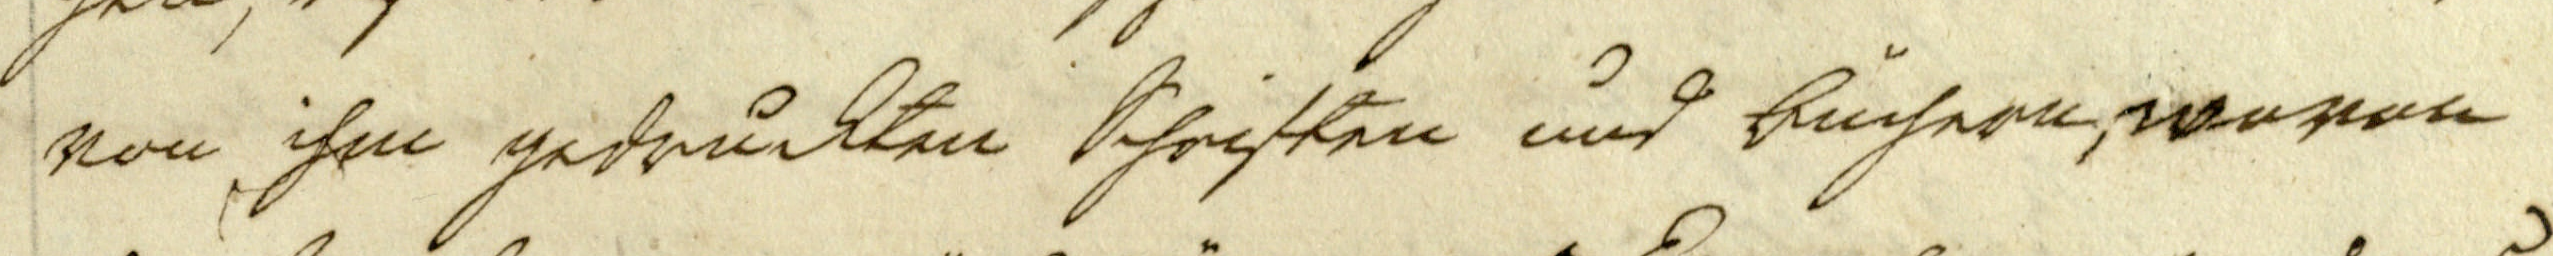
von ihm gedruckten Schriften und Büchern, wovon
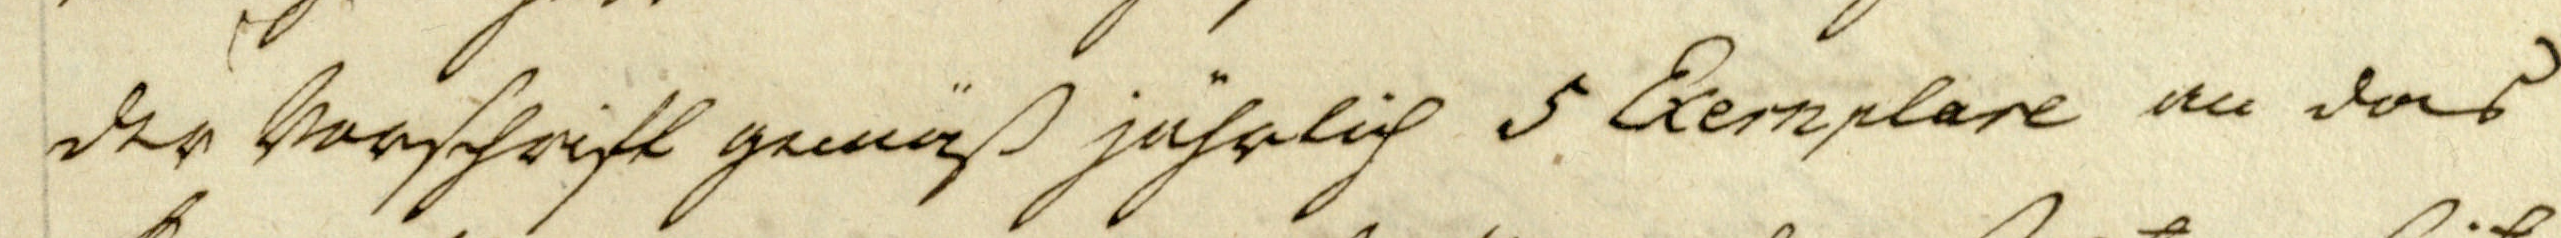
der Vorschrift gemäß jährlich 5 Exemplare an das
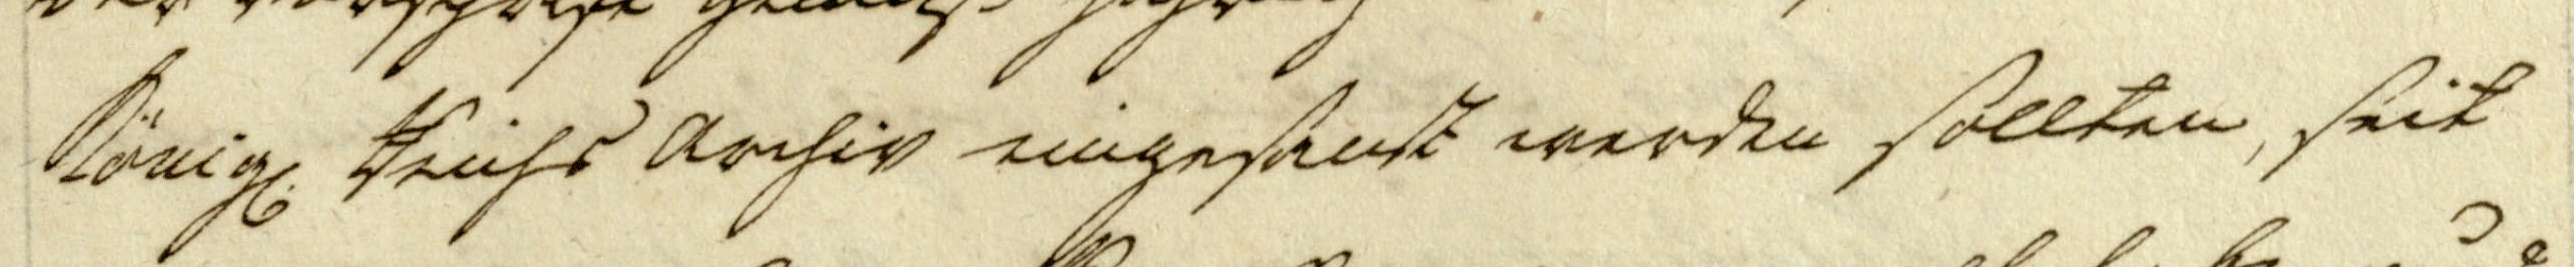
Königl. Reichs Archiv eingesandt werden sollten, seit
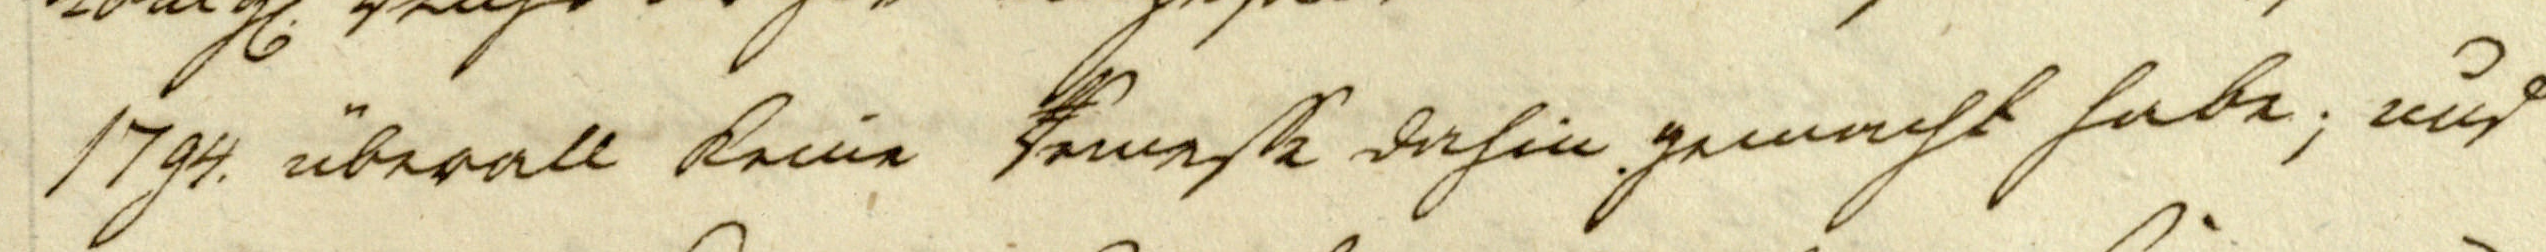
1794. überall keine Remesse dahin gemacht habe, und
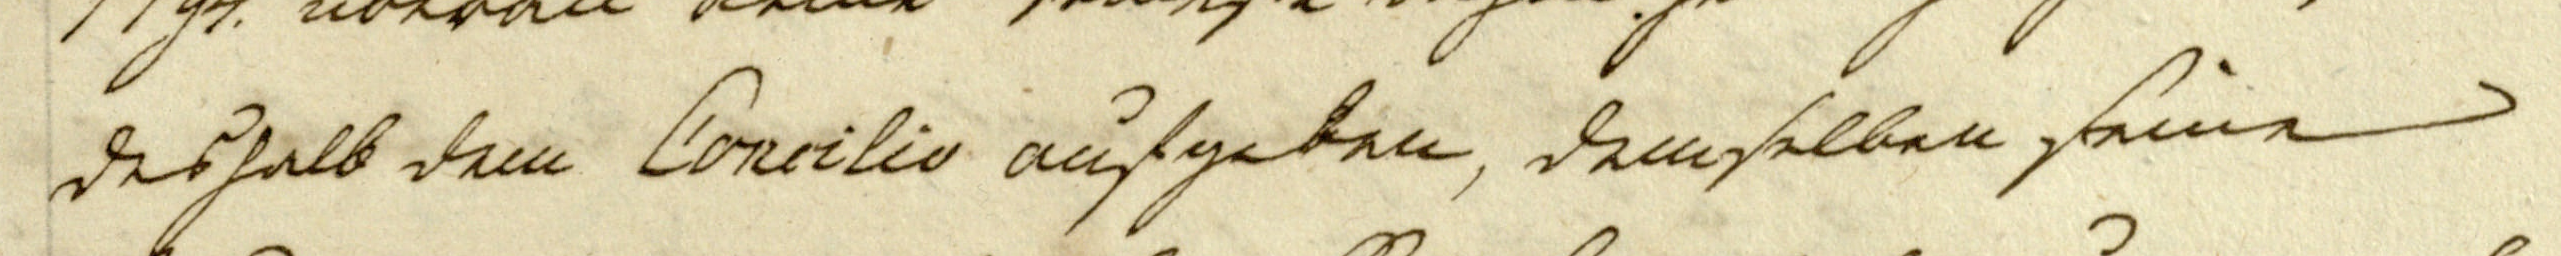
deshalb dem Concilio aufgeben, demselben seine
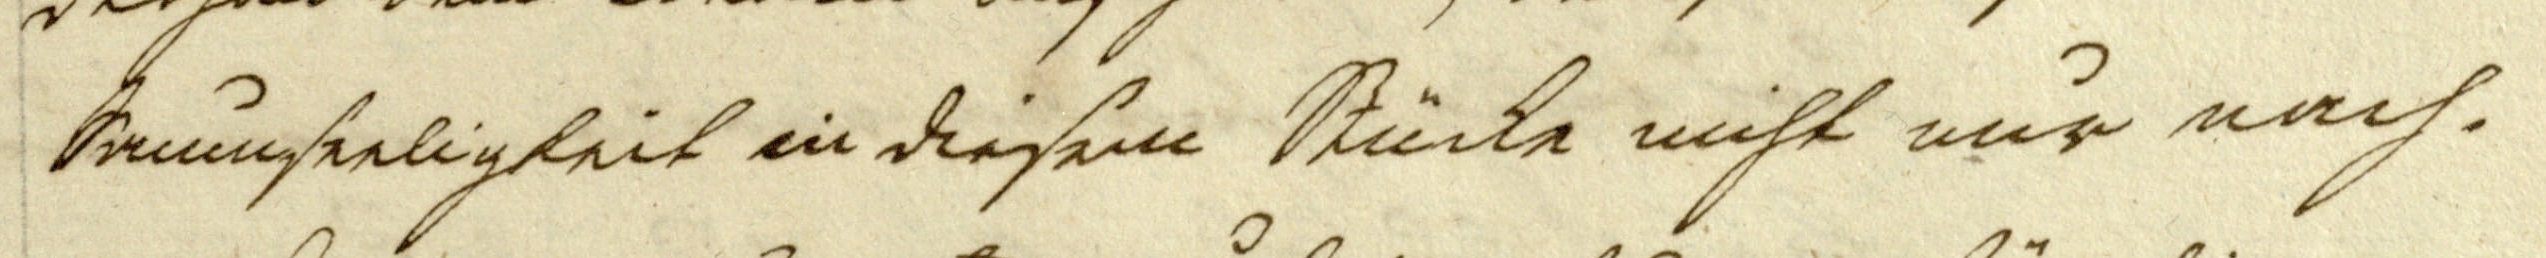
Saumseeligkeit in diesem Stücke nicht nur nach¬
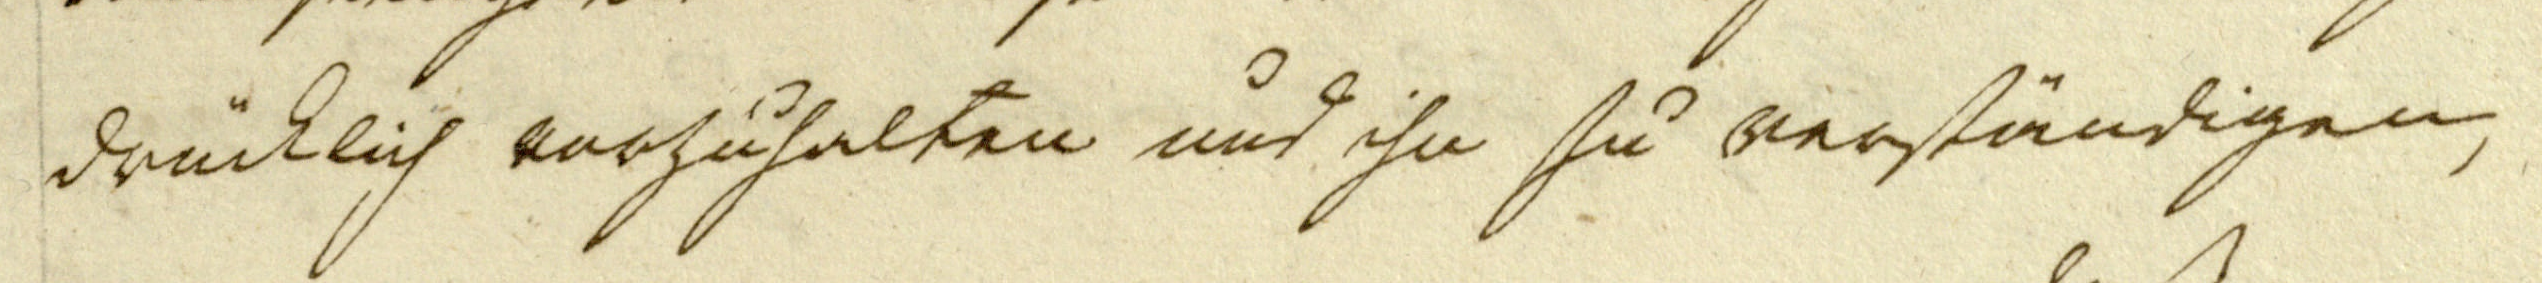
drücklich vorzuhalten und ihn zu verständigen
